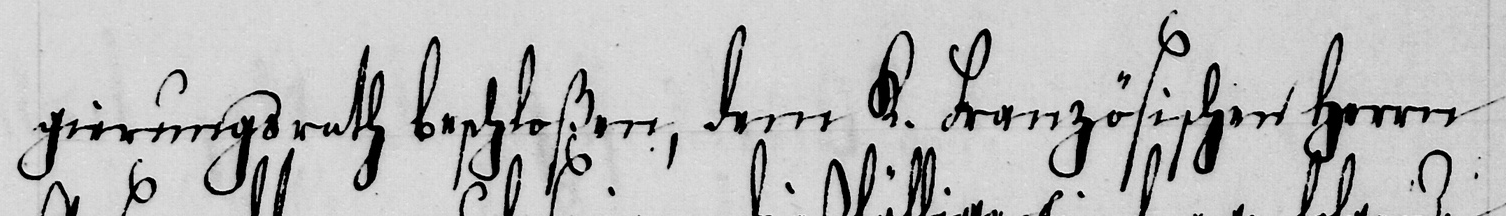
gierungsrath beschloßen, dem K. Französischen Herrn
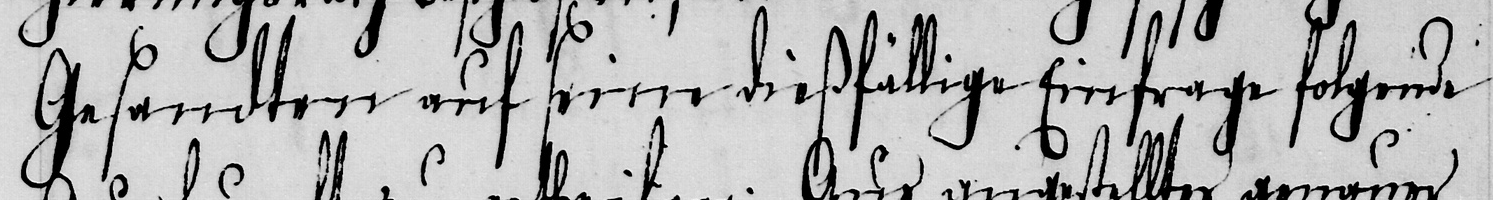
Gesandten auf seine dießfällige Einfrage folgen¬
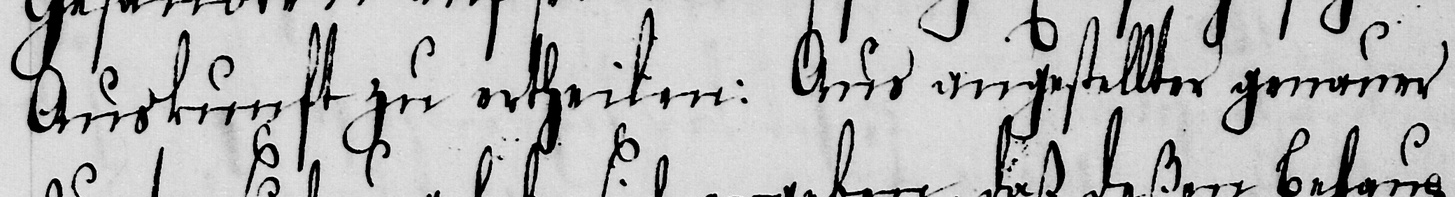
Auskunft zu ertheilen: Aus angestellter genauer
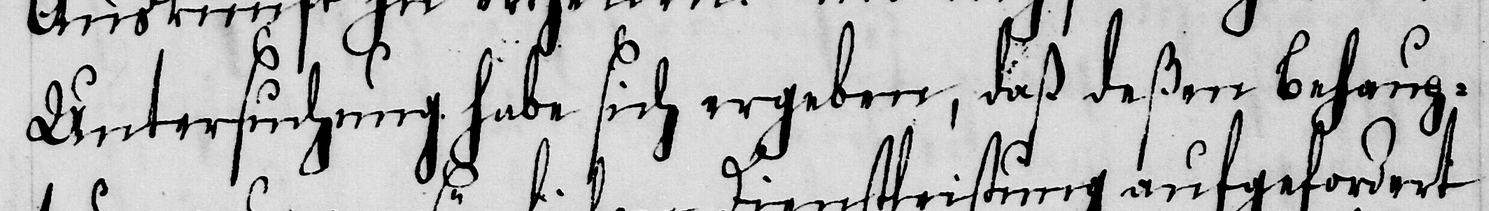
Untersuchung habe sich ergeben, daß deßen Behaup¬
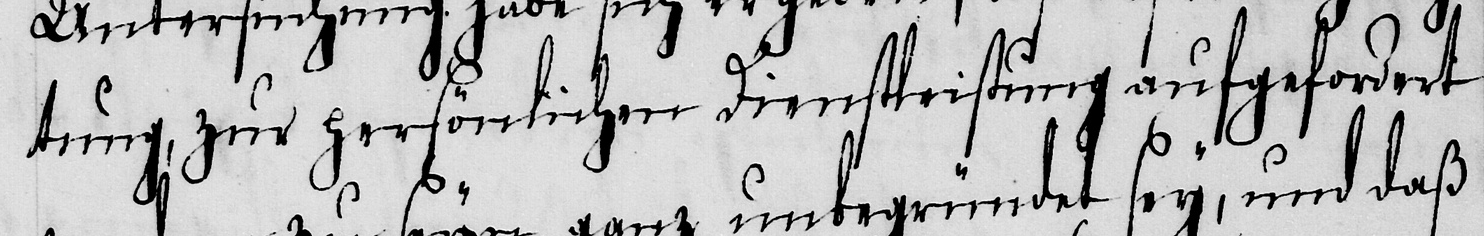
tung, zur persönlichen Dienstleistung aufgefordert
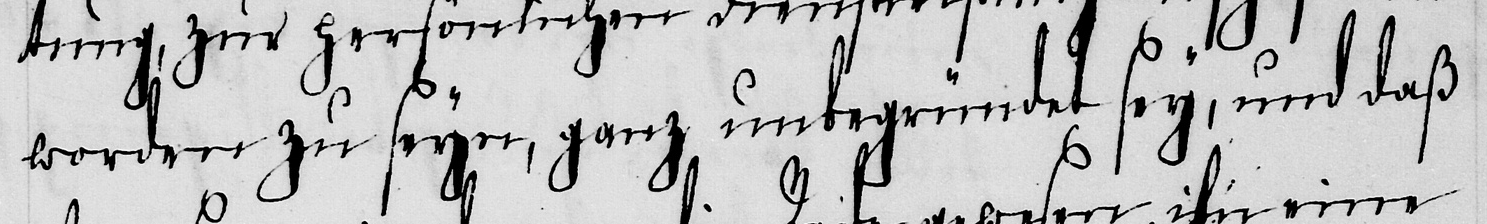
worden zu seyn, ganz unbegründet sey, und daß
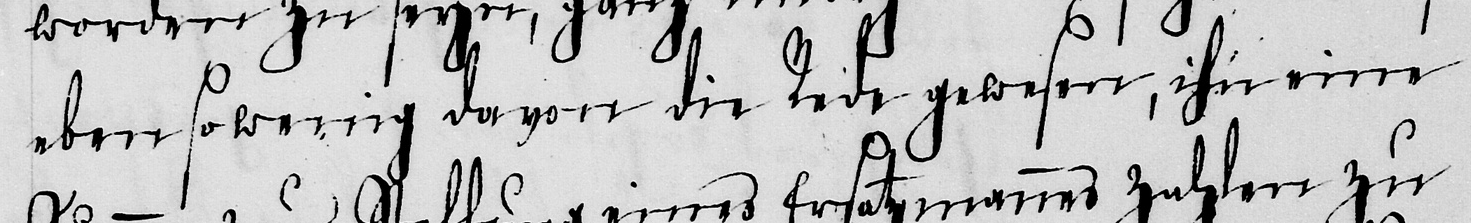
ebensowenig davon die Rede gewesen, ihn eine
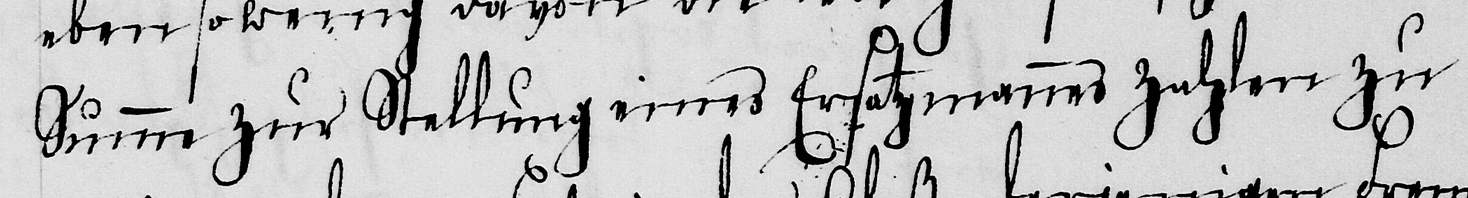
Summe zur Stellung eines Ersatzmannes zahlen zu
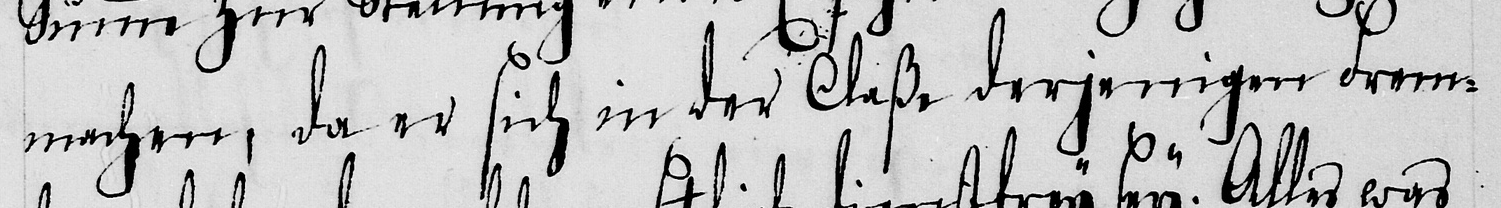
machen, da er sich in der Claße derjenigen Frem¬
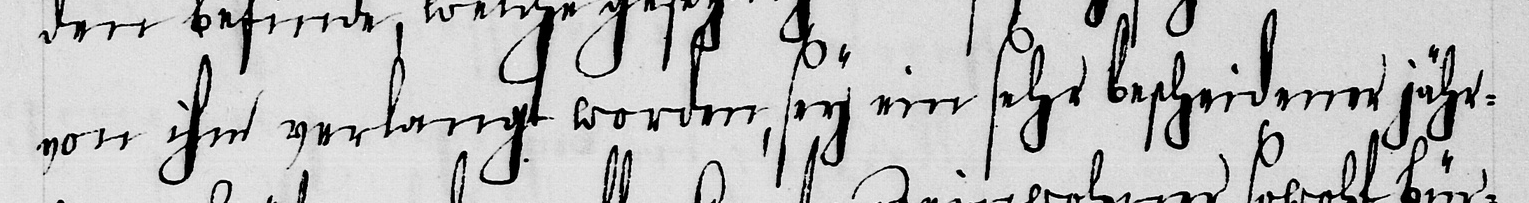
von ihm verlangt worden, sey ein sehr bescheidener jähr¬
